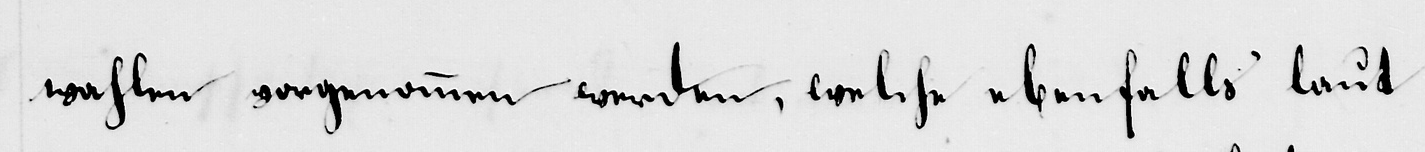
wahlen vorgenommen werden, welche ebenfalls laut
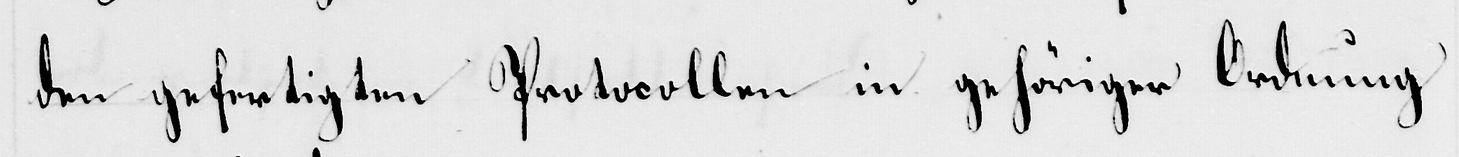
den gefertigten Protocollen in gehöriger Ordnung
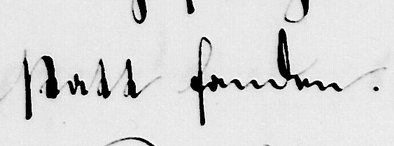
statt fanden.
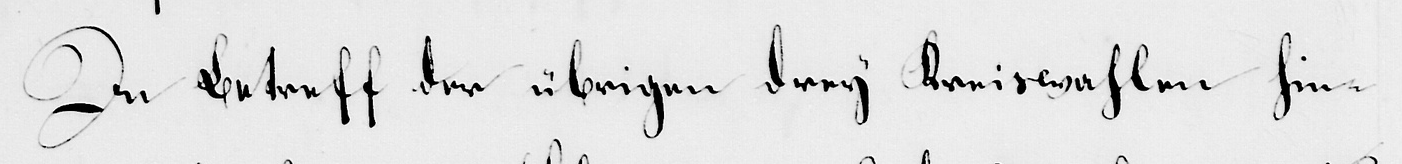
In Betreff der übrigen drey Kreiswahlen hin¬
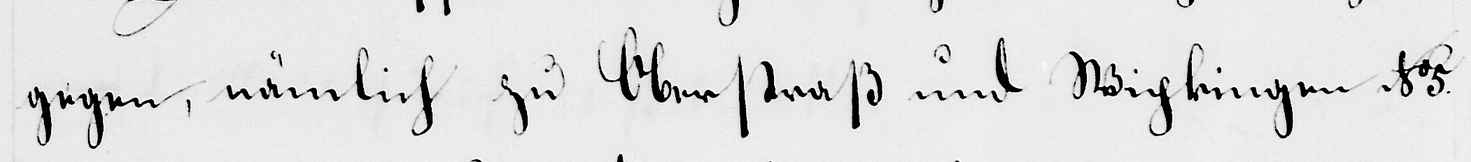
gegen, nämlich zu Oberstraß und Wipkingen N°5.
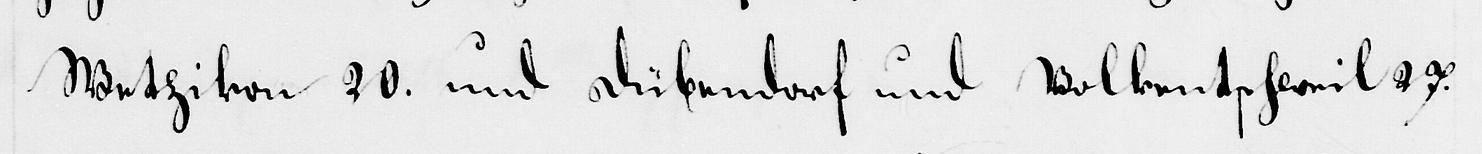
Wetzikon 20. und Dübendorf und Volkentschweil 27.
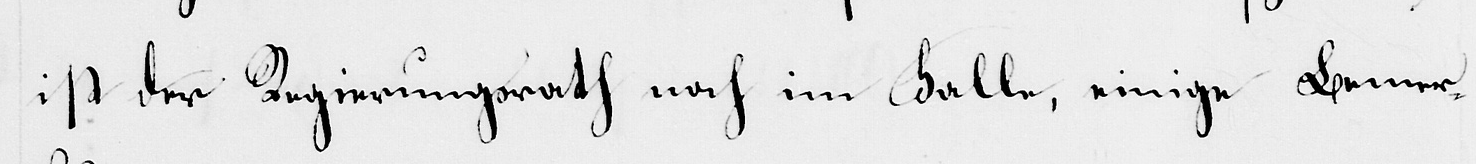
ist der Regierungsrath noch im Falle, einige Bemer¬
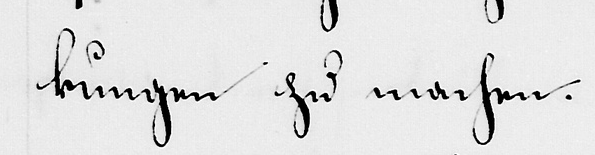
kungen zu machen.
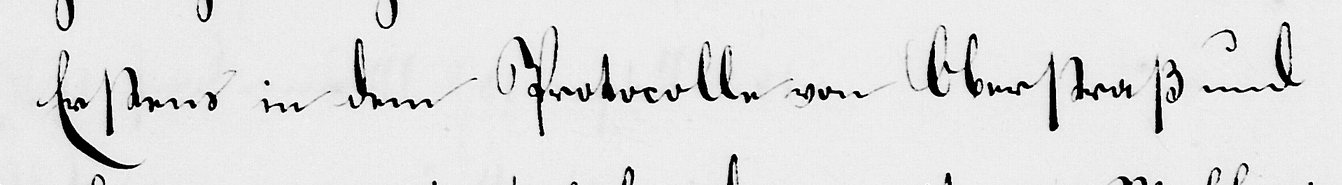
Erstens in dem Protocolle von Oberstraß und
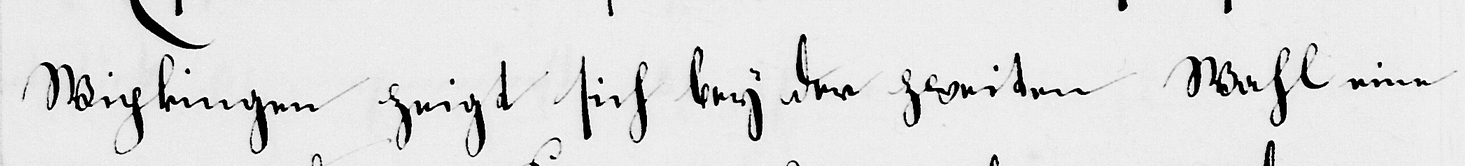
Wipkingen zeigt sich bey der zweiten Wahl eine
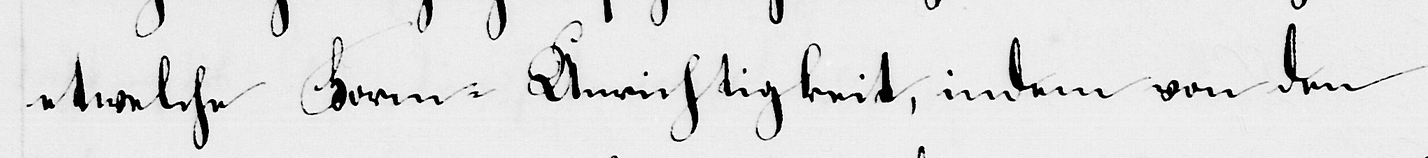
etwelche Form-Unrichtigkeit, indem von den
